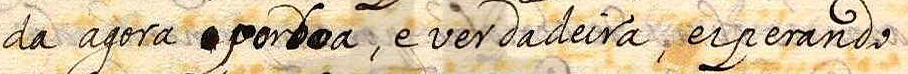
da agora _ por boa, e verdadeira, esperando
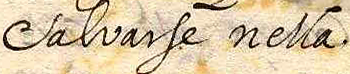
Salvarse nella.
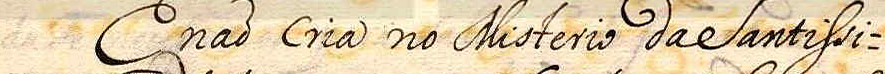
E naõ cria no Misterio da Santissi
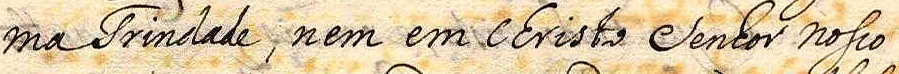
ma Trindade, nem em Christo Senhor nosso
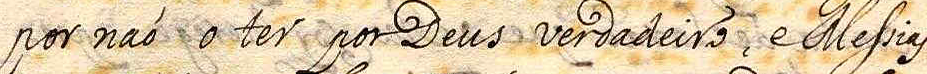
por naõ o ter por Deus verdadeiro, e Messias
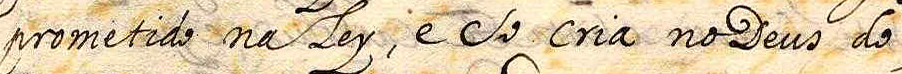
prometido na Ley, e so cria no Deus do
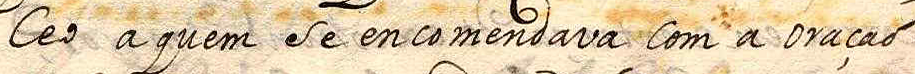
Ceo a quem se encomendava com a oraçaõ
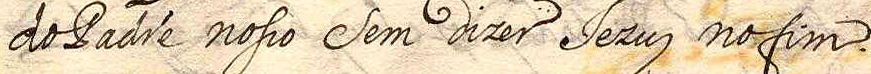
do Padre nosso Sem dizer Jezus no fim.
